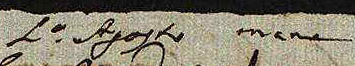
Lo. Agosto mana
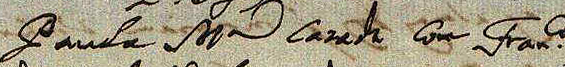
Paula Ma cazada com Fran.co
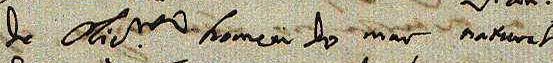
de Oliv.ra homem do mar, natural
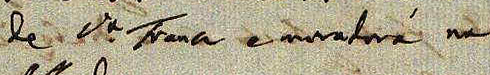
de V.a Franca e moradora na
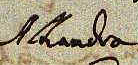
Alhandra
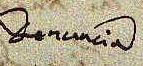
Denuncia
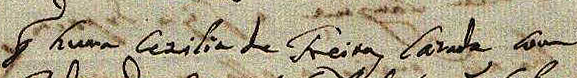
q̄ huma Cezilia de Freitas Cazada com
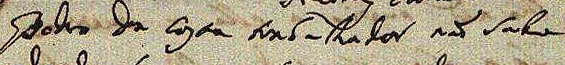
Pedro da Costa trabalhador naõ sabe
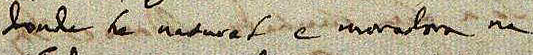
donde he natural e moradora na
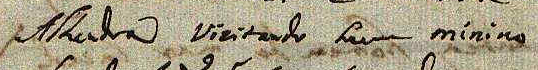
Alhandra vizitando hum minino
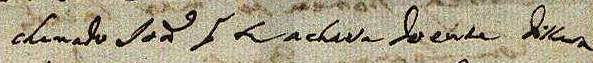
chamado Ioaõ q̄ se achava doente dissera
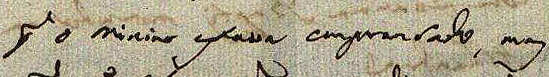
pa o minino estava emprensado, mas
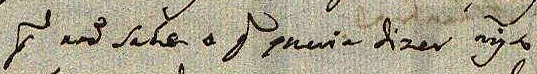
p̄ o naõ saber o q̄ queria dizer nisto
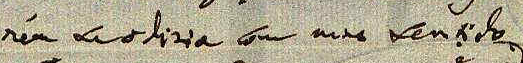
nem se o dizia com mui sentido
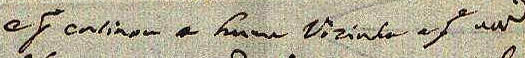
e q̄ ensinou a huma Vizinha e q̄ naõ
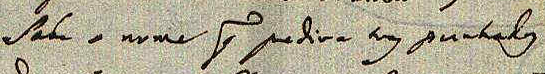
sabe o nome q̄ pedira tres punhados
